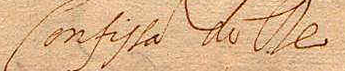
Confissā do Reo
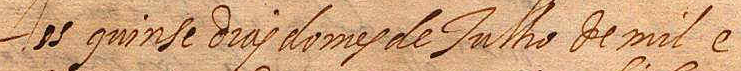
Aos quinse dias do mes de Julho de mil e
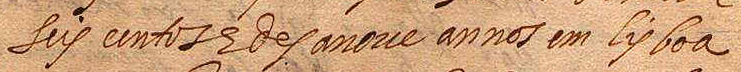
seiscentos E desanoue annos em lisboa
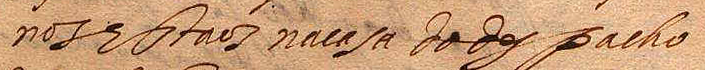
nos Estaos na casa do despacho
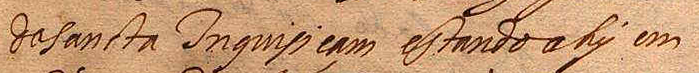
da sancta Inquisiçam estando ahy em
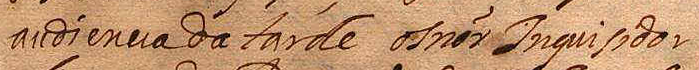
audiencia da tarde o snōr Inquisidor
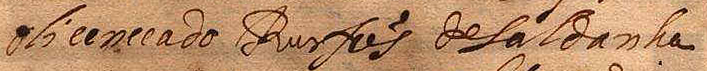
o licenceado Rui frez̄ de saldanha
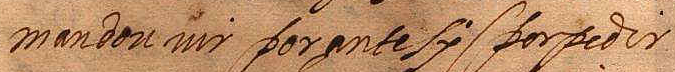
mandou uir porante sy (por pedir
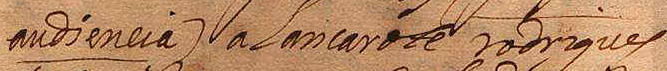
audiencia) a Lançarote rodrigues
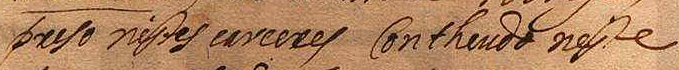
preso nestes carceres Contheudo neste
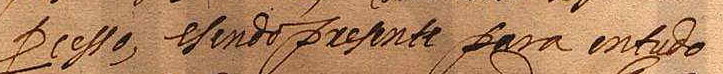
ꝓcesso, e sendo presente para en tudo
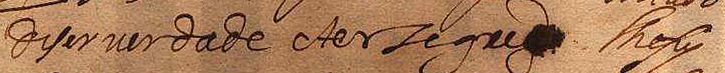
diser uerdade e ter segre_ lhe foj
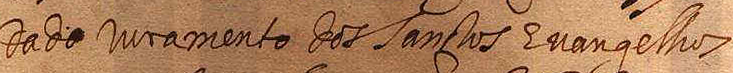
dado Iuramento dos sanctos Euangelhos
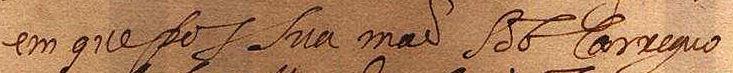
em que pos sua mão sob Carreguo
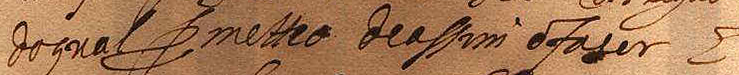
do qual ꝓmetteo de assim o faser E
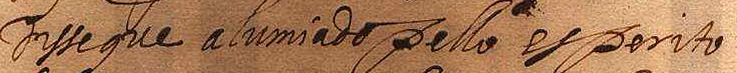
disse que alumiado pello Esperito
